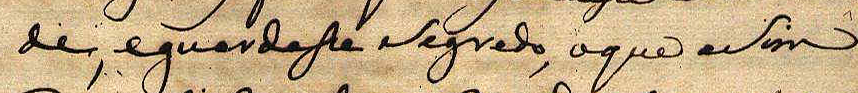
de, e guardasse segredo, o que aSim
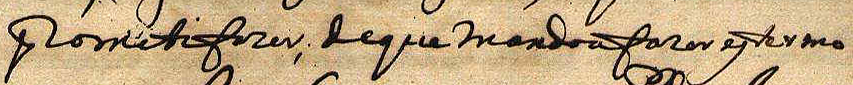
prometi fazer; de que mandou fazer es termo
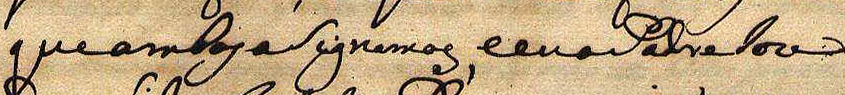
que ambos asignamos, e eu o Padre Ioze
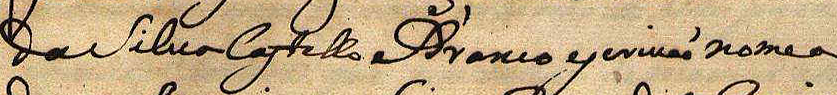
da Silua Castello Branco escriuaõ nomea
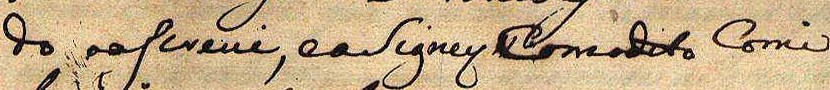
do o escreui, e asigney Com o dito Comi
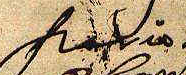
ssario.
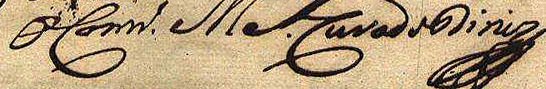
O Com.o Mel. Curado Dinis
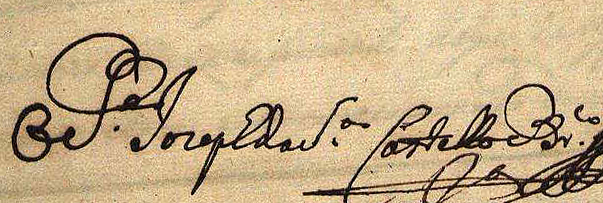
O P.e Iozeph da S.a Castello Br.co
